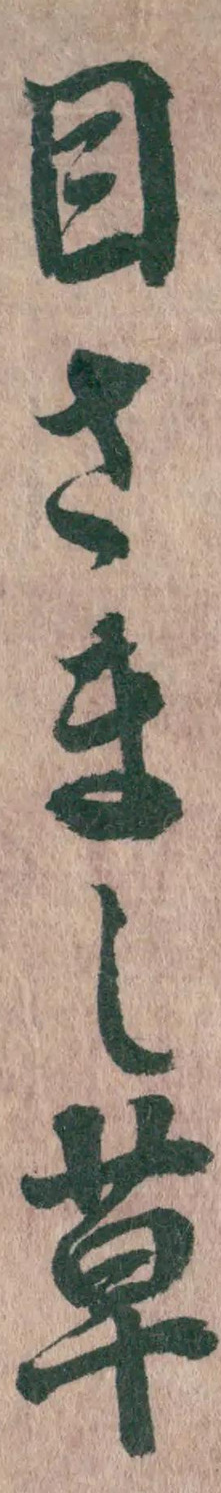目さまし草

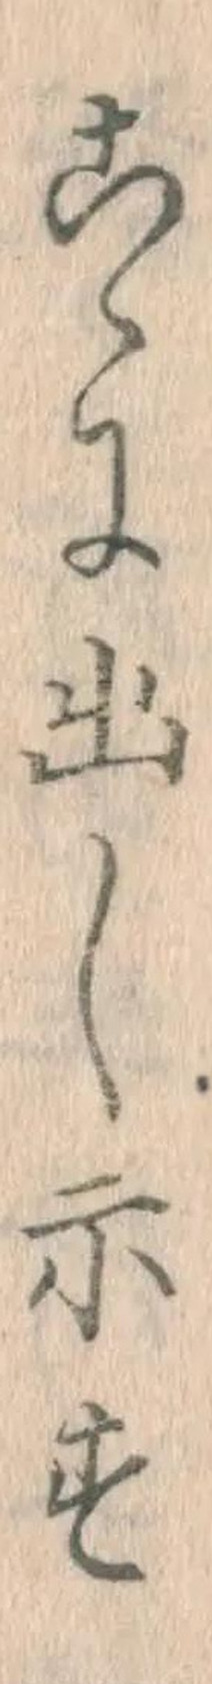こゝに出し示す
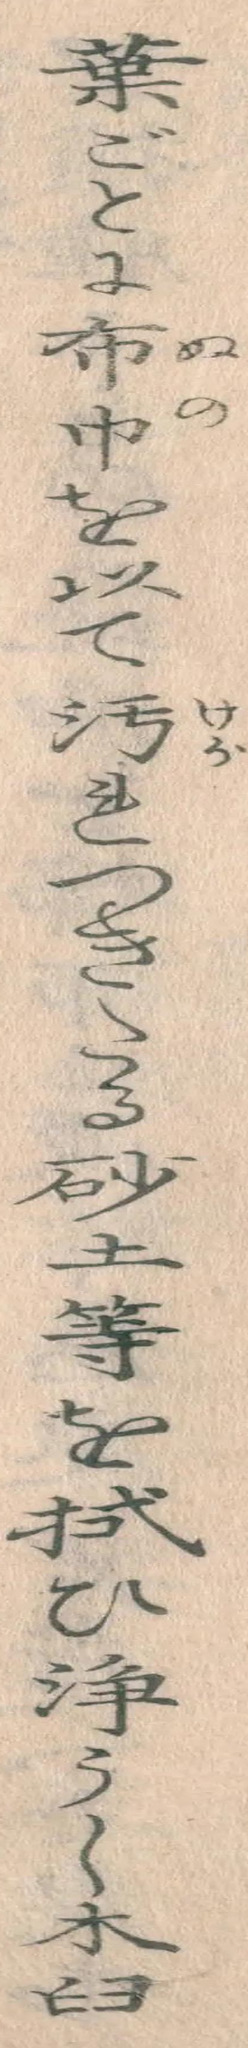葉ごとに布巾を以て汚れつきたる砂土等を拭ひ浄うし木臼
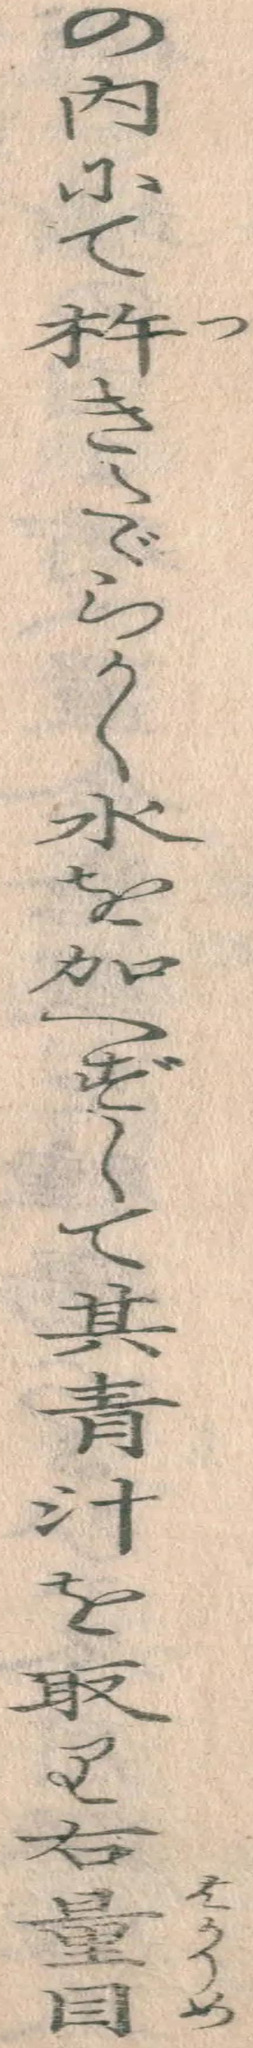の内にて杵きたゞらかし水を加へずして其青汁を取り右量目
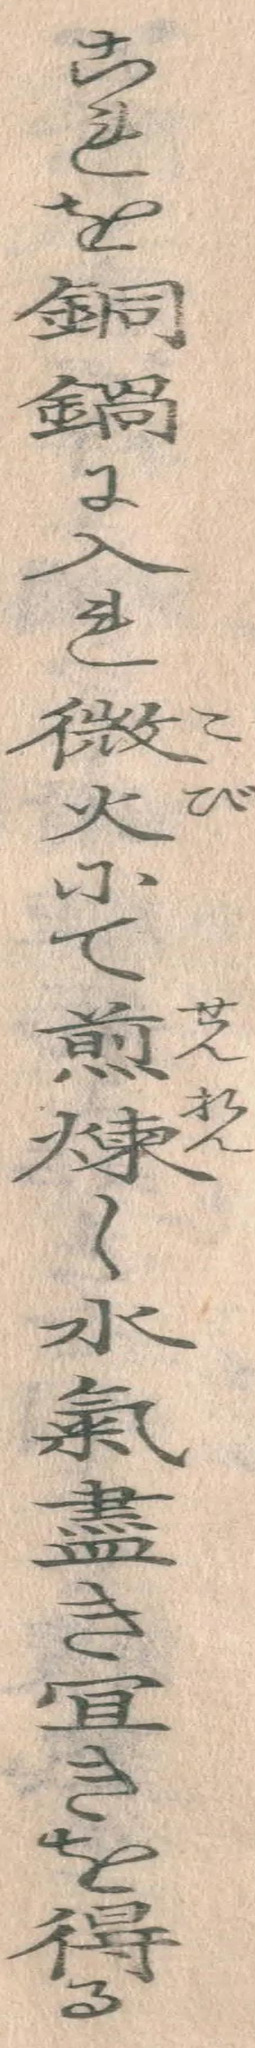これを銅鍋に入れ微火にて煎煉し水気尽き宜きを得る
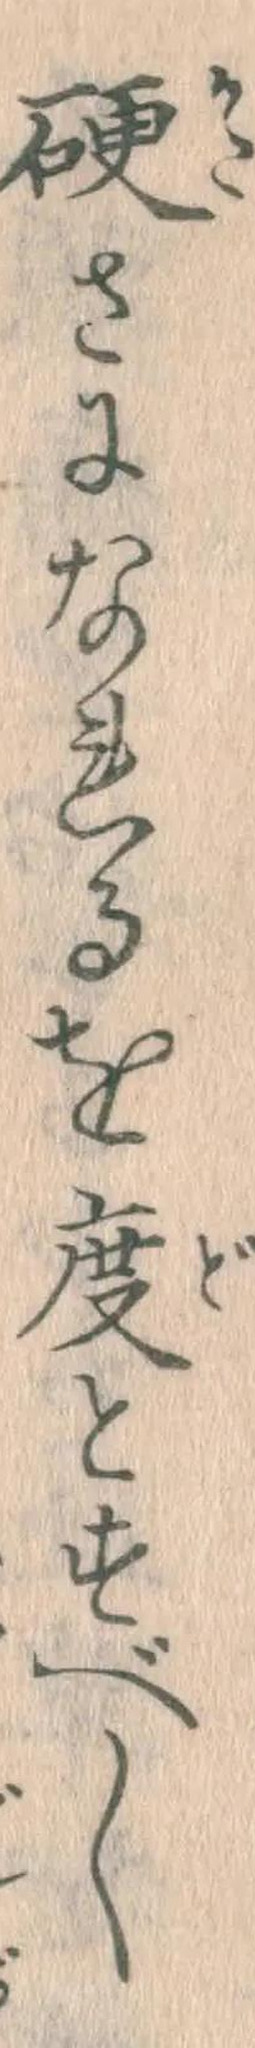硬さになれるを度とすべし
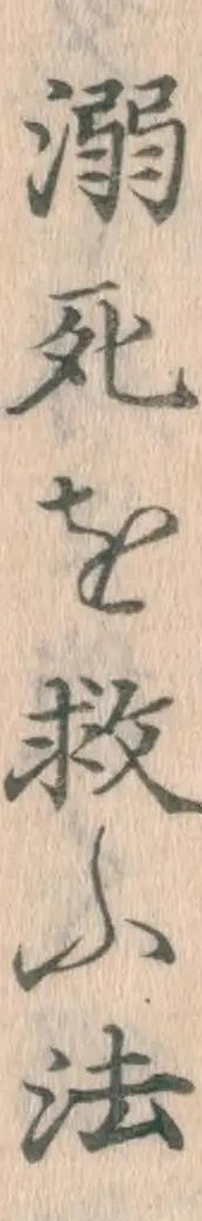溺死を救ふ法
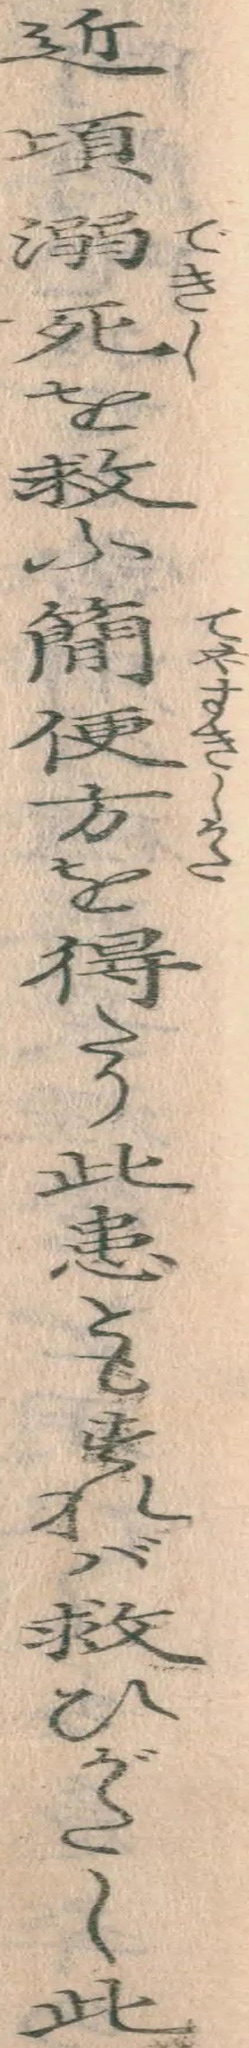近頃溺死をす救ふ簡便方を得たり此患ともすれば救ひがたし此
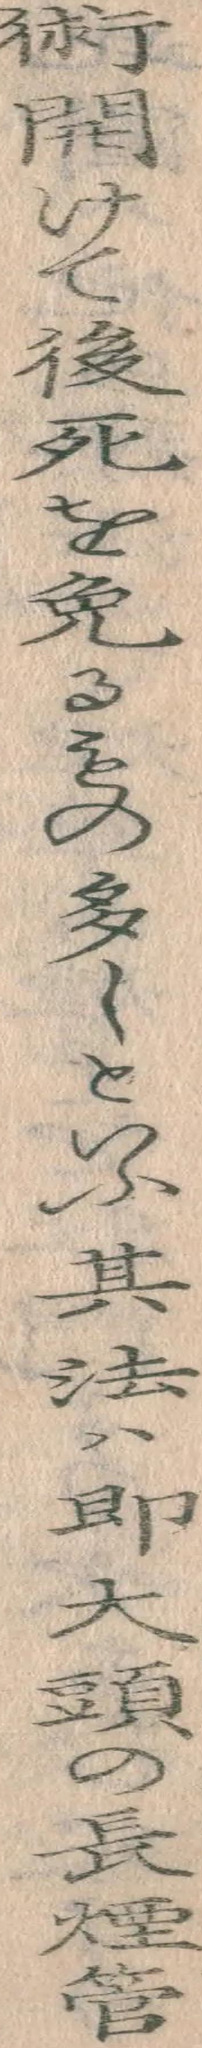術開けて後死を免るもの多しといふ其法は即大頭の長煙管
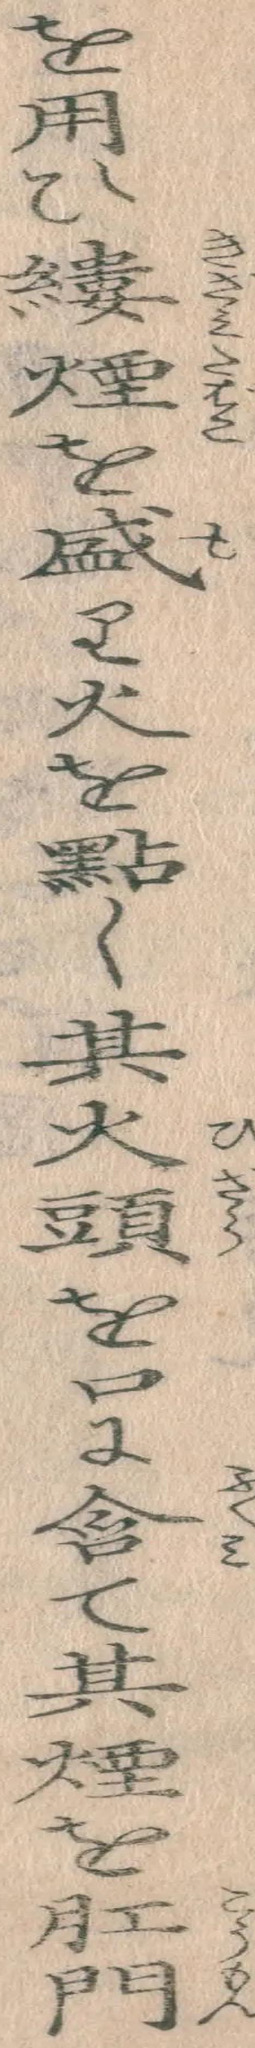を用ひ縷煙を盛り火を点し其火頭を口に含て其煙を肛門
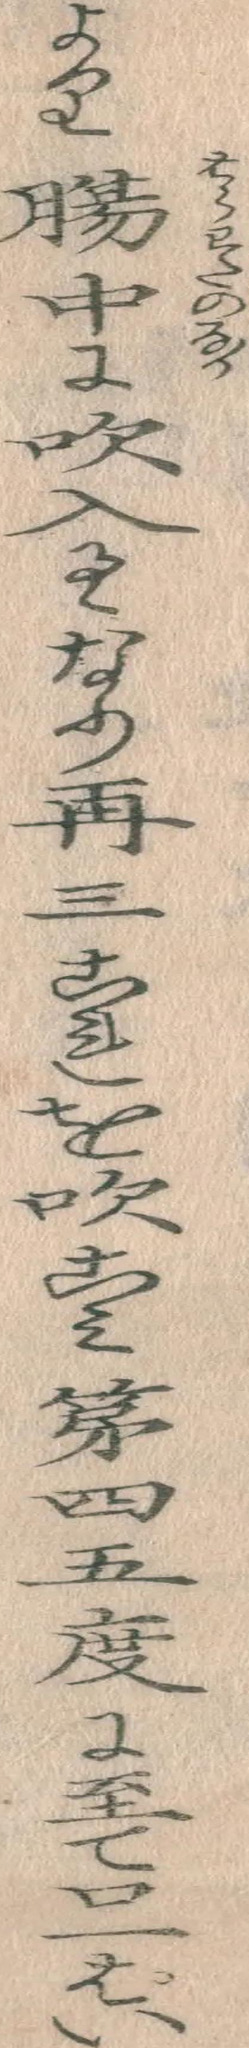より腸中に吹入るなり再三これを吹こみ第四五度に至て口一ぱい
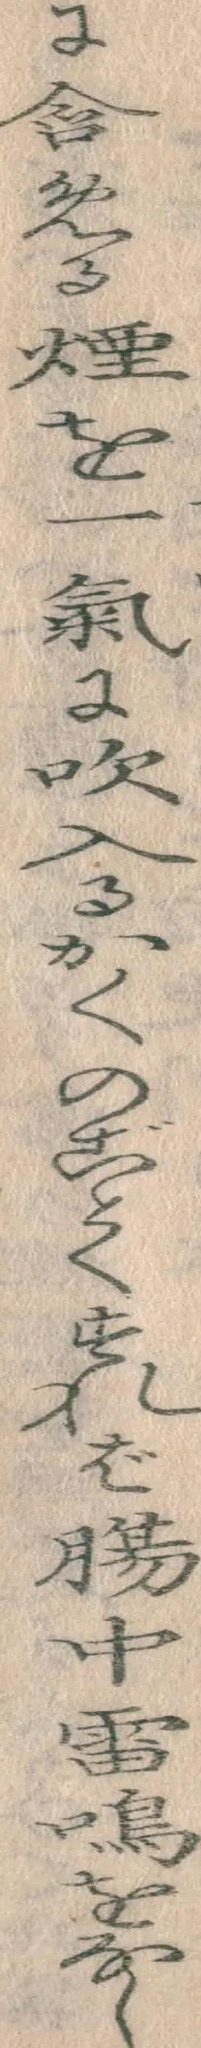に含める煙を一気に吹入るかくのごとくすれば腸中雷鳴をなし
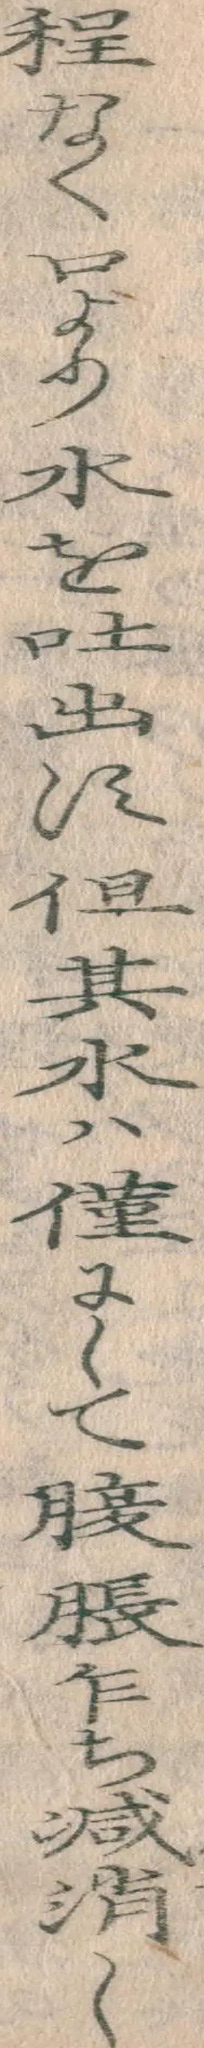程なく口より水を吐出す但其水は僅にして腹張乍ち減消し
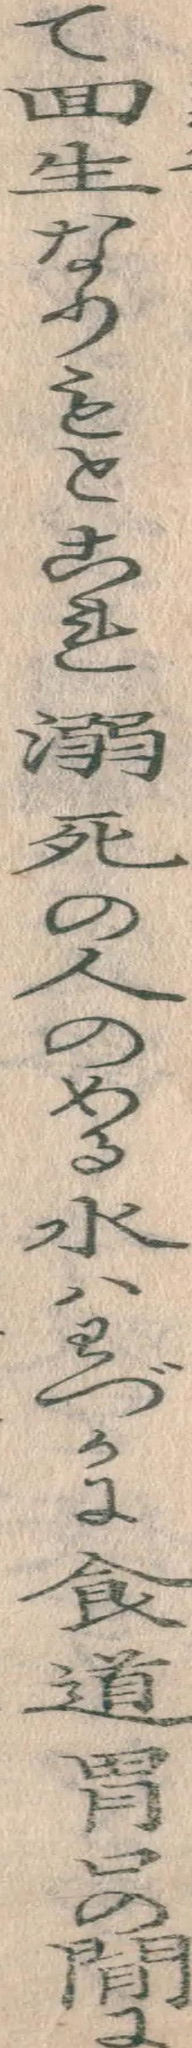て回生なりもとこれ溺死の人のめる水はわづかに食道胃口の間に
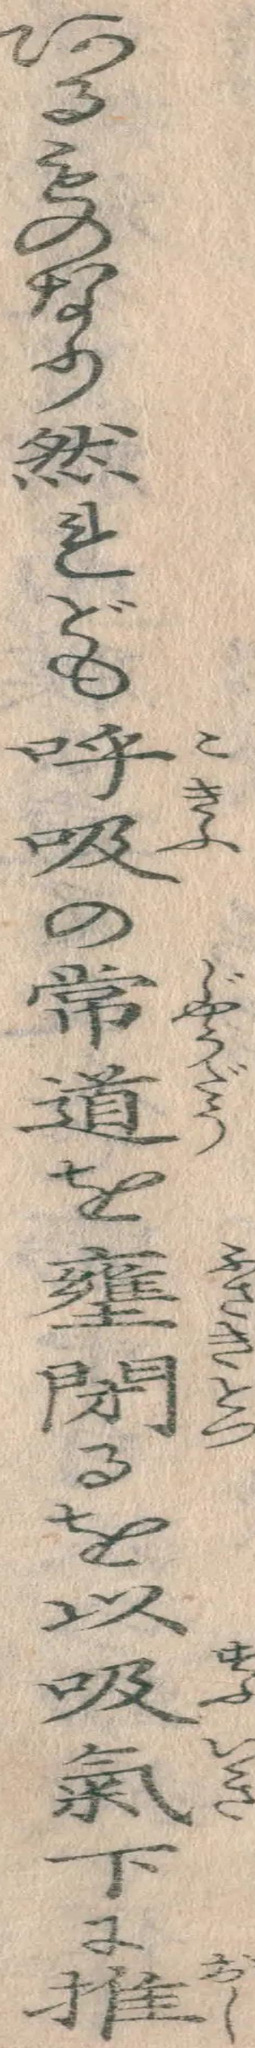あるものなり然れども呼吸の常道を壅閉るを以吸気下に推
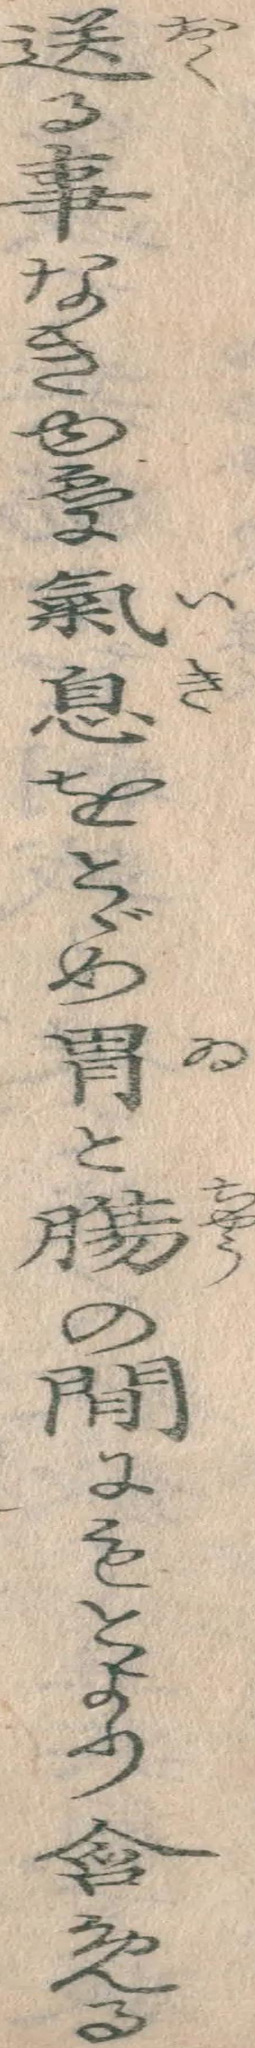送る事なきゆゑに気息をとゞめ胃と腸の間にもとより含める
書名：目さまし草
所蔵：国立国会図書館 National Diet Library, JAPAN
